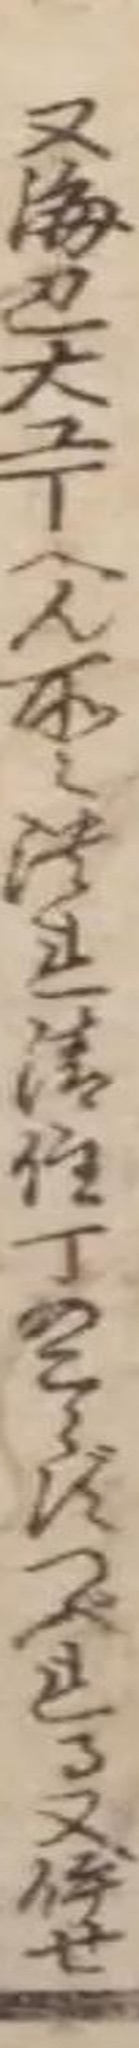又海辺大由丁へん所々潰れ清住丁のこらずつぶれる又併せ
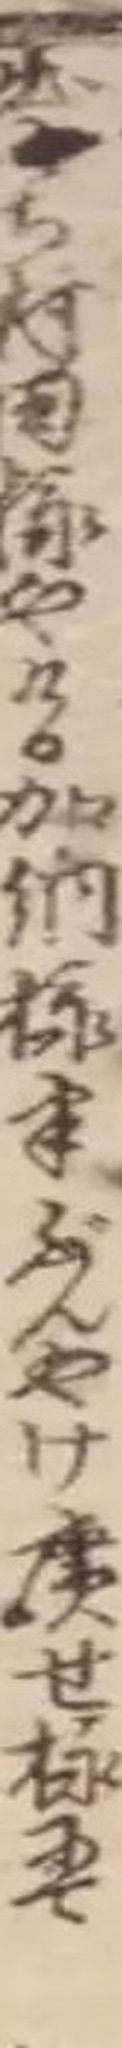出ち村田様やける加納様半ぶんやけ廣せ様にて
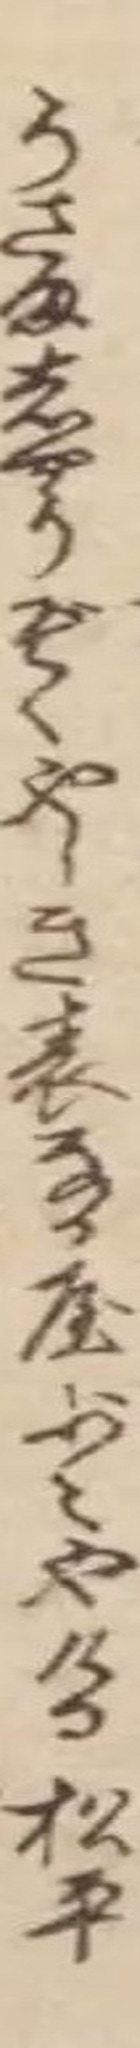うさましやうぞくやしき表なか屋少〃やける松平
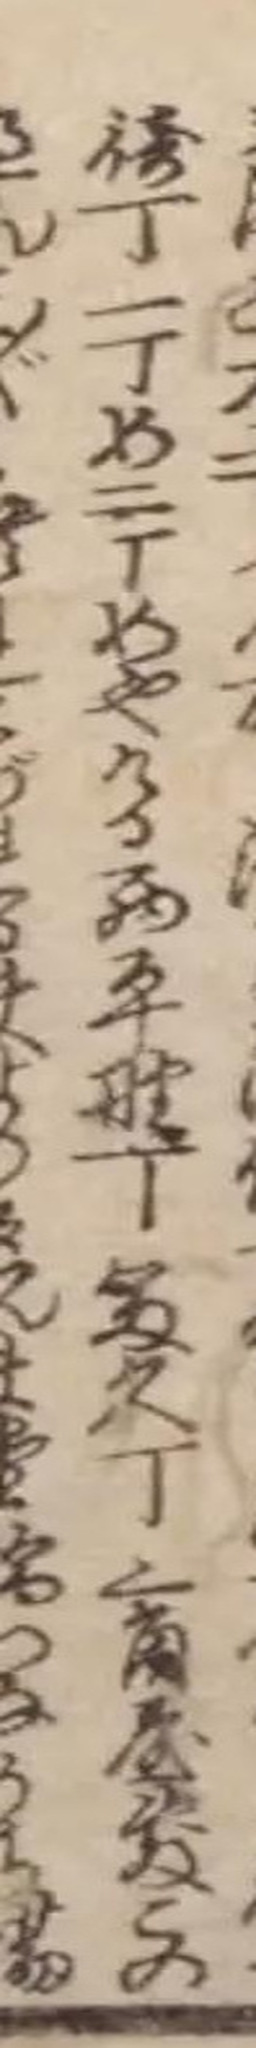へんこと〴〵く潰れくづれる夫よりゑんま堂橋つなうち場
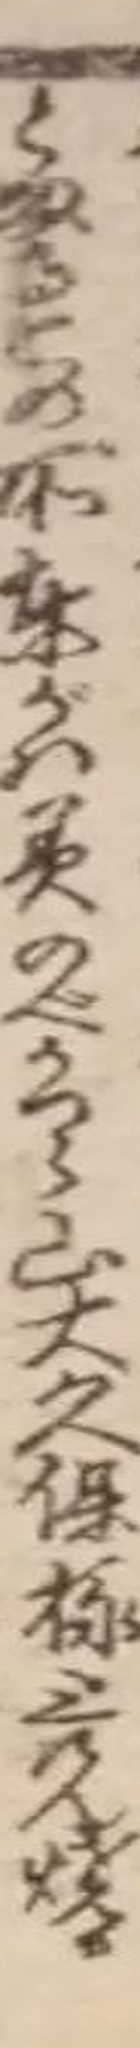とまるこの所東がは美のべかつら山大久保様三けん焼る
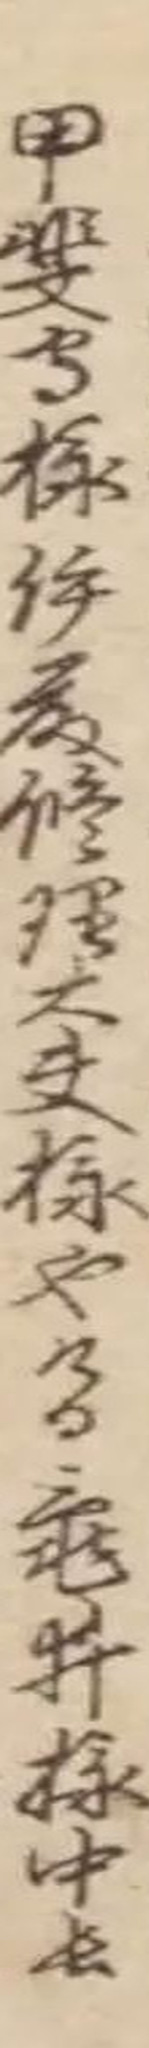甲斐守様伊藤修理大夫様やける亀井様中長
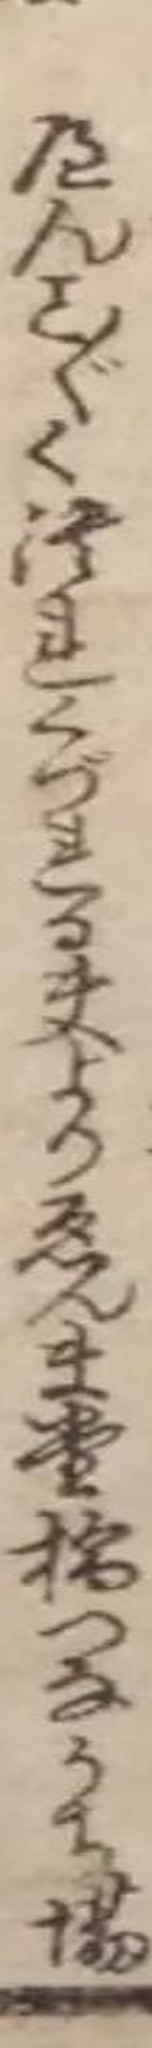へんこと〴〵く潰れくづれる夫よりゑんま堂橋つなうち場
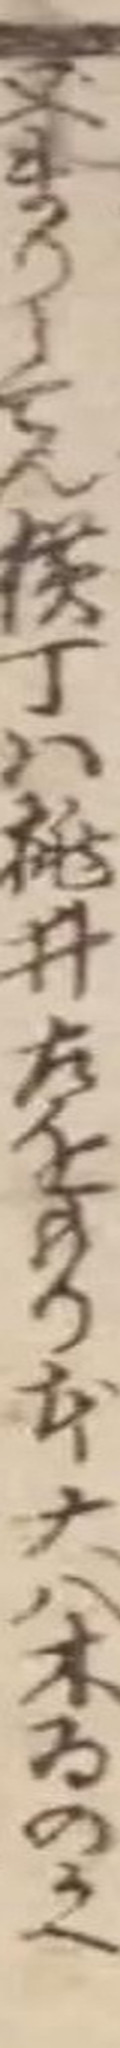又まりしてん横丁は桃井左近もり本大八木ゐのうへ
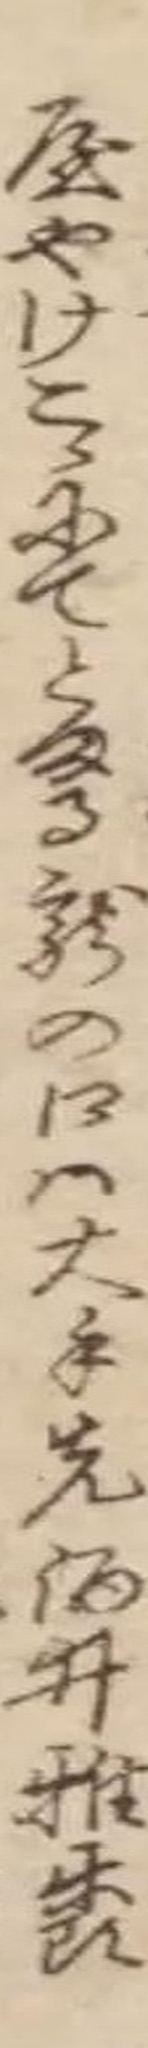屋やけこゝにてとまる鷲の口は大手先酒井雅楽頭
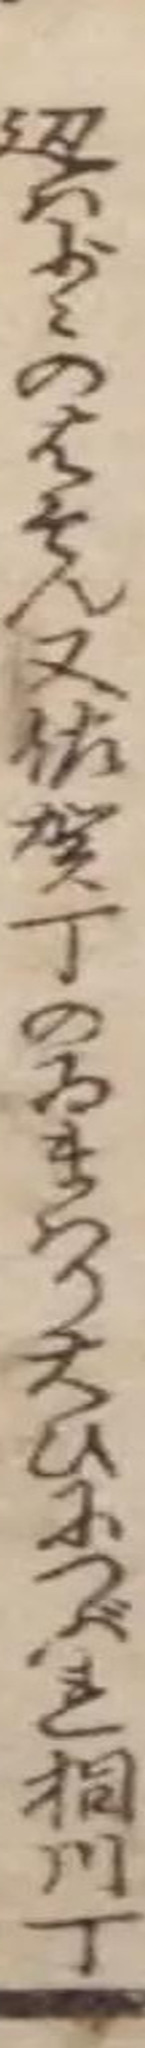辺は少々のはそん又佐賀丁のゐまはり大ひにつぶれ桐川丁
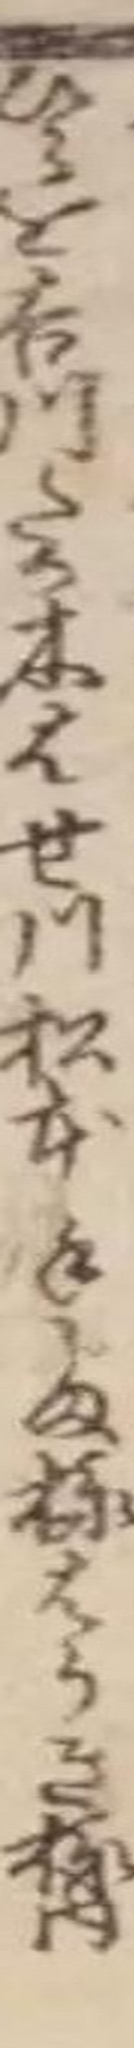ひろを吉川たか木はせ川松本手じま様はうき様内
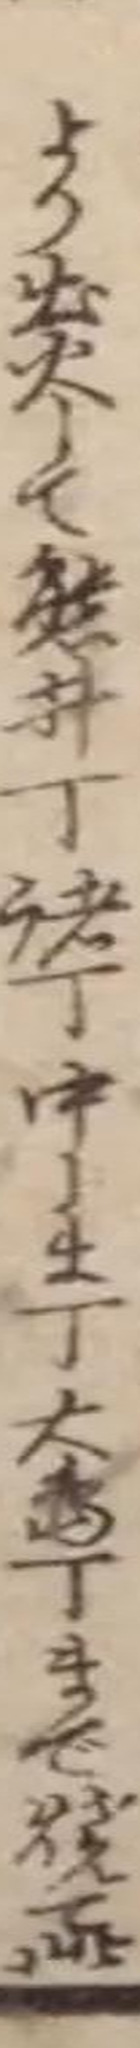より出火して熊井丁諸丁中しま丁大島丁まで焼て此
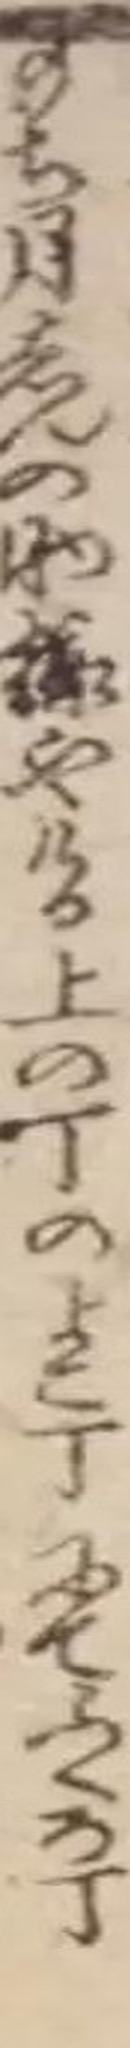もち月しんの助様やける上の丁のよこ丁にてふくろ丁
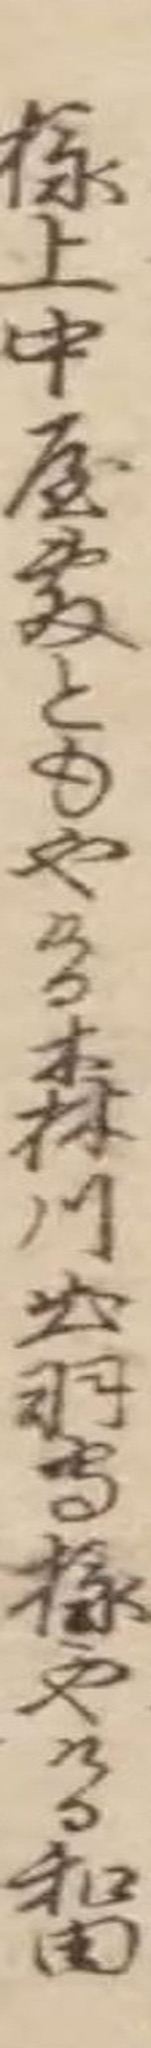様上中屋敷ともやける森川出羽守様やける和田
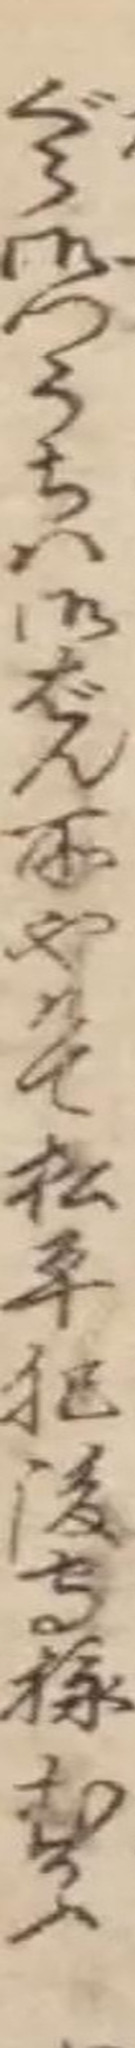ぐら御門うちは御ばん所やけて松平肥後守様むかふ
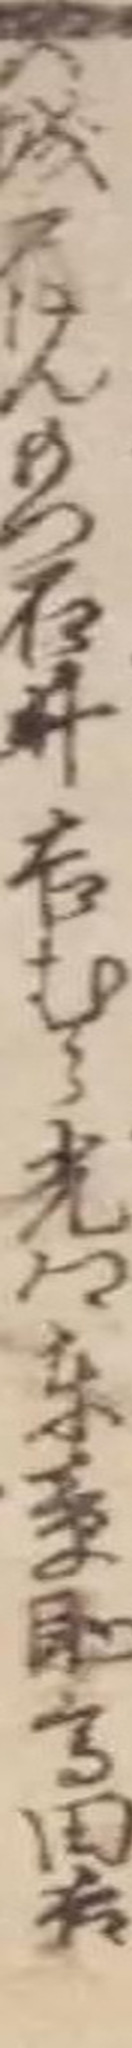は城戸けんもつ石井吉むら光門東助高田吉
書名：関東大地震末代鑑
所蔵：国立国会図書館 National Diet Library, JAPAN
